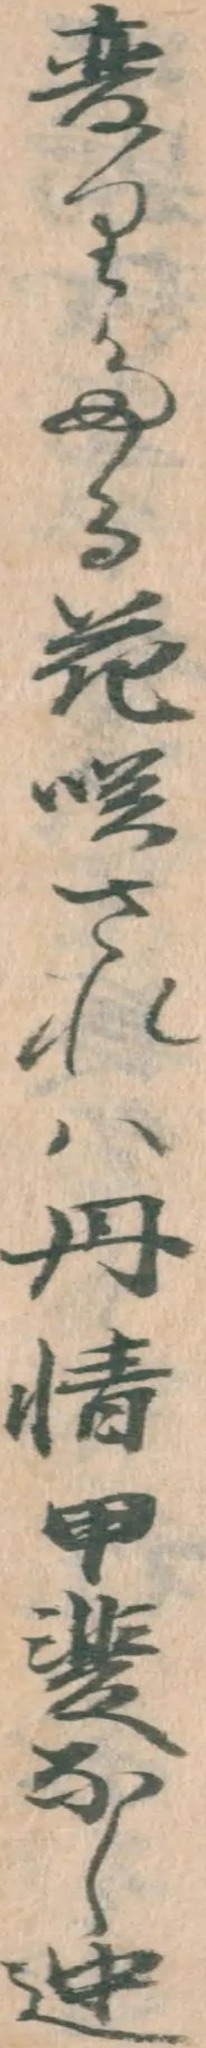変りたる花咲されは丹精甲斐なし迚
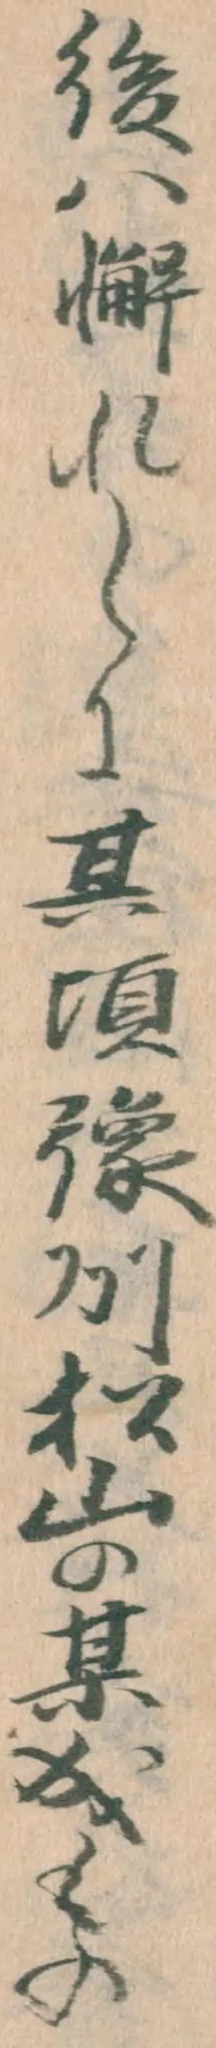後は懈れしに其頃豫洲松山の某成もの

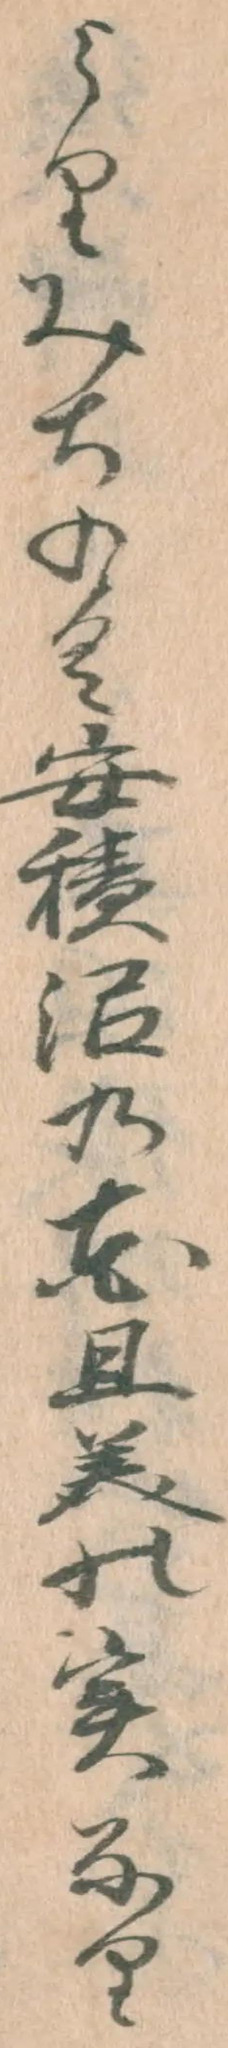よりみちのく安積沼の花且美の実なり
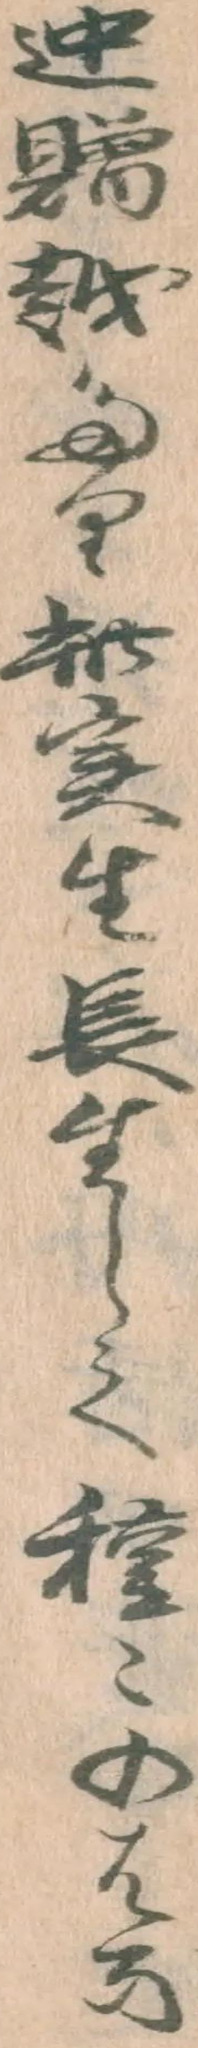迚贈越たり此実生長生して種々のはな
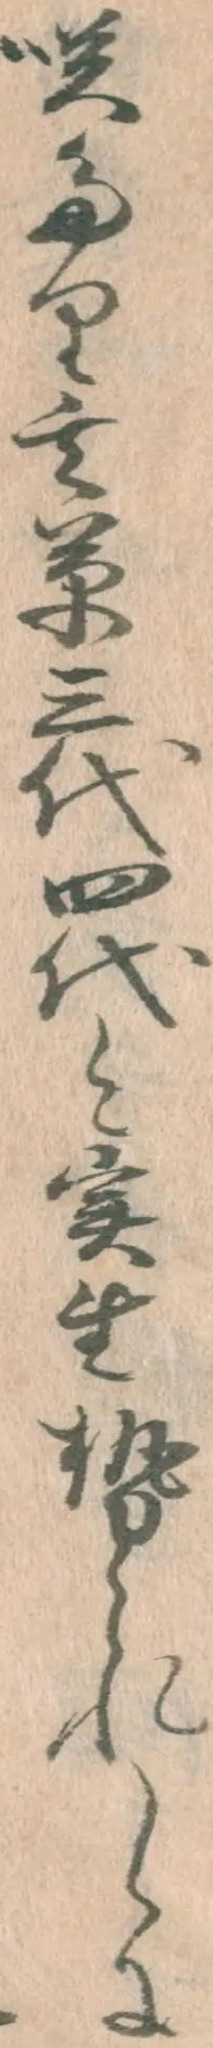咲たり其草三代四代と実生勢られしに
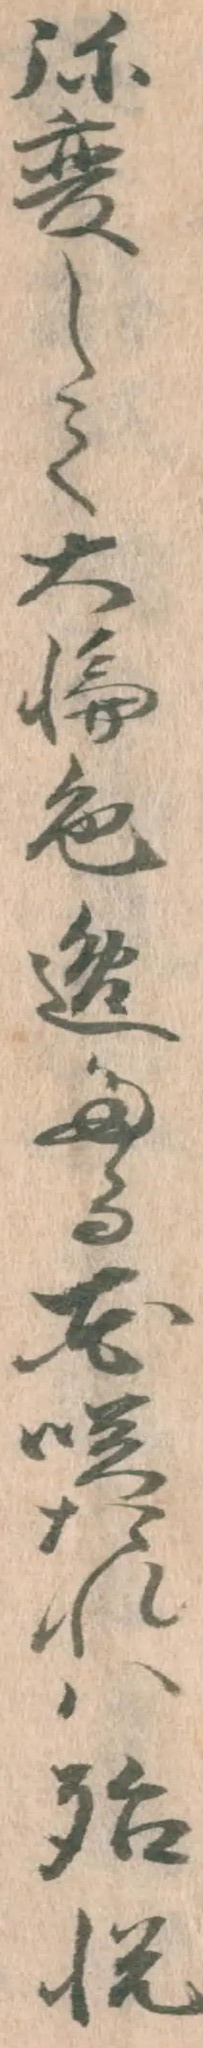弥変して大輪色逸たる花咲たれは殆悦
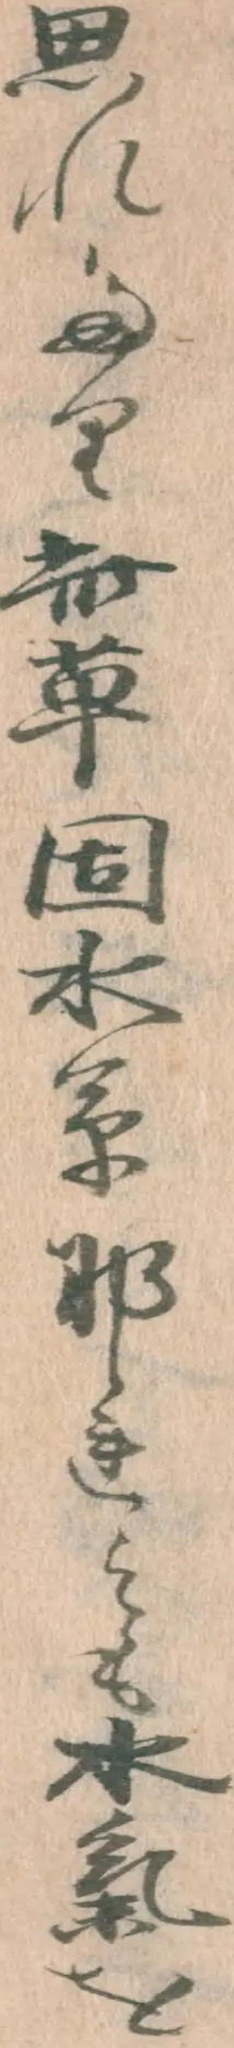思れたり此草固水草なれとも水気を
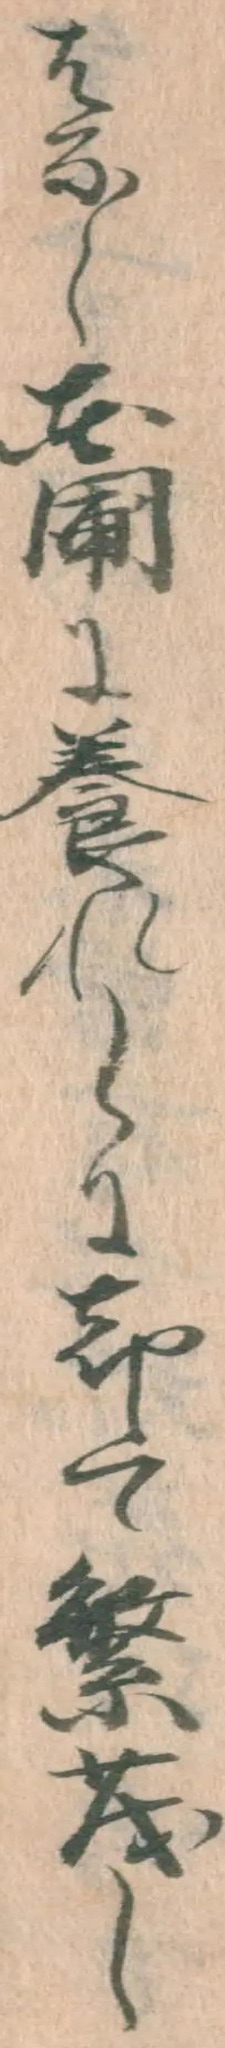はなし花圃に養れしに却て繁茂し
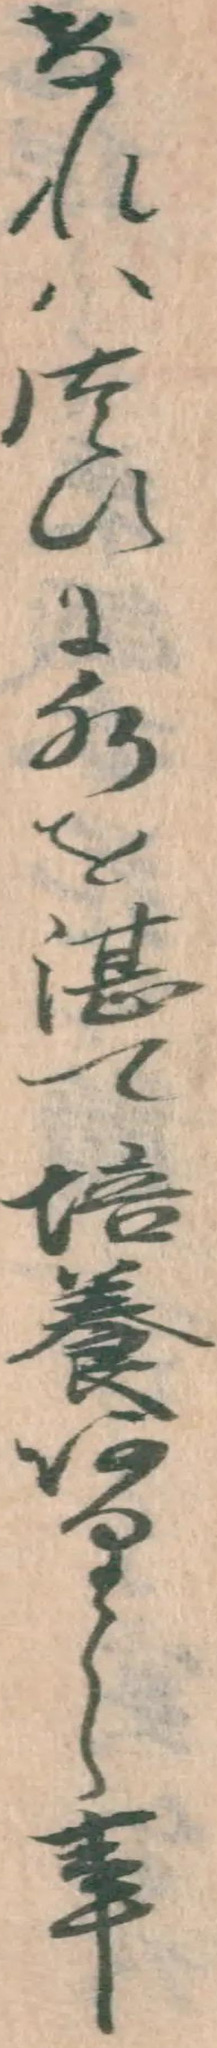たれはつひに水を湛て培養ありし事
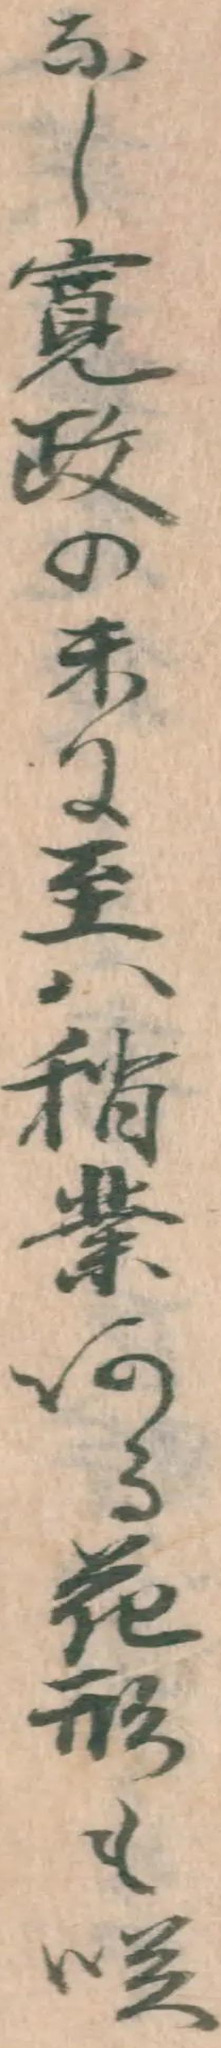なし寛政の末に至は稍業ある花形も咲
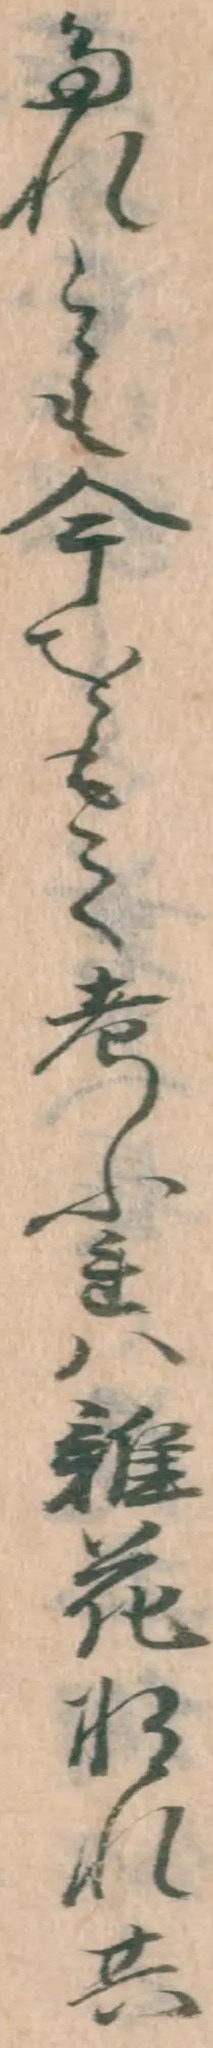たれとも今をもて考ふれは雑花なれ共
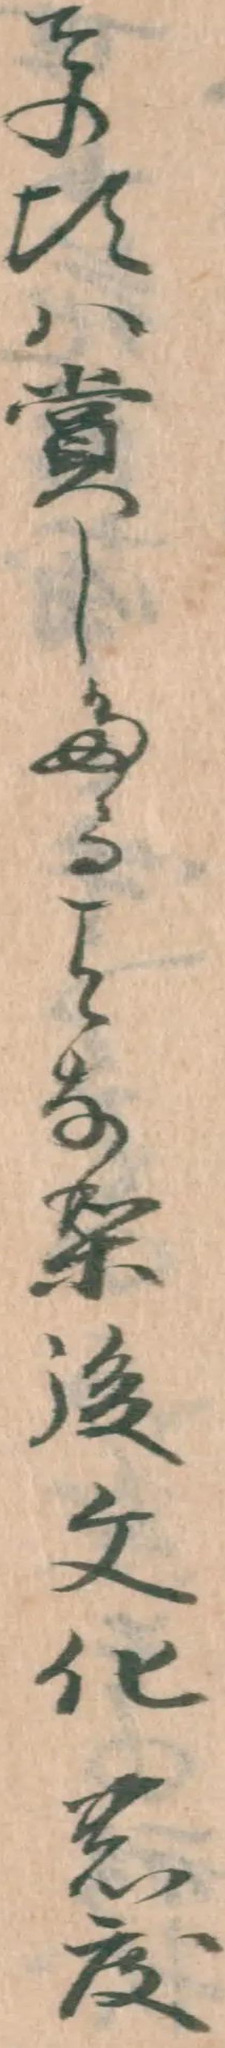その頃は賞したることなり後文化の夏
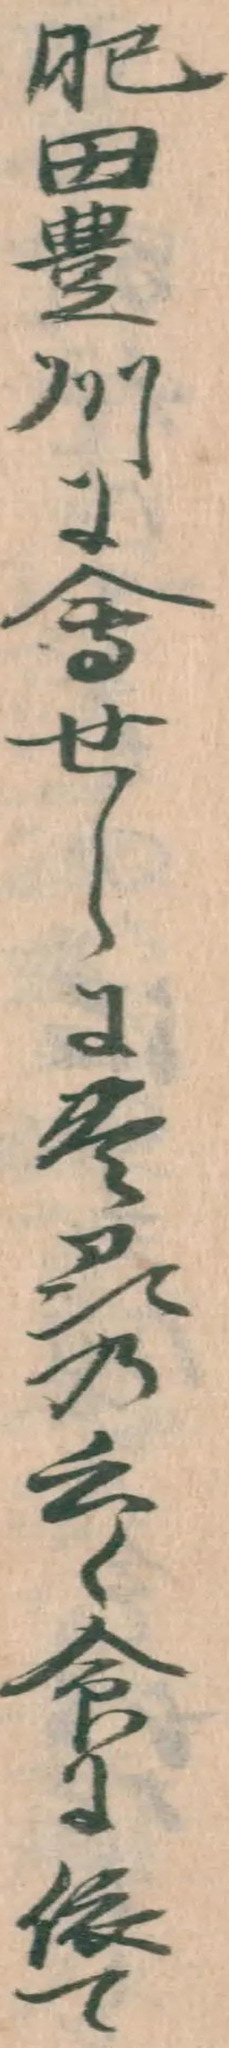肥田豊洲に会せしに尽の命に依て
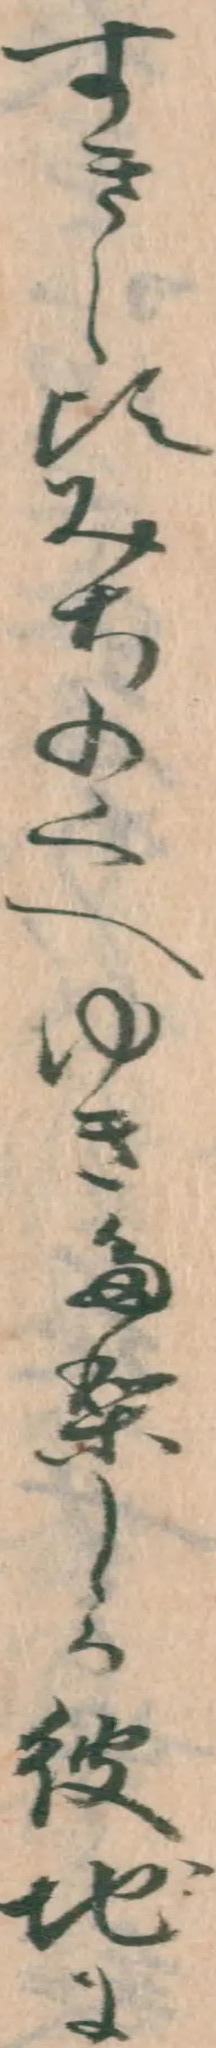すきし頃みちのくへゆきたりしか彼地に
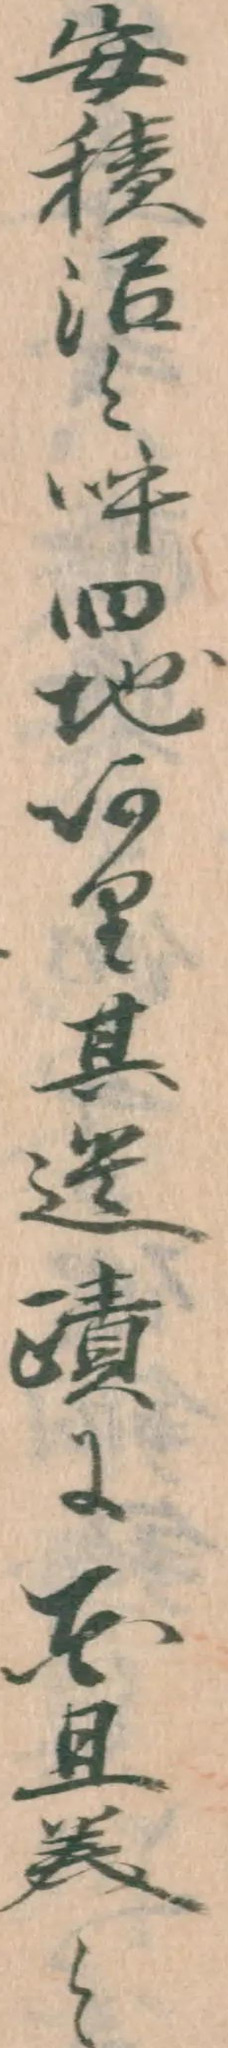安積沼と呼田地あり其遺蹟に花且美と
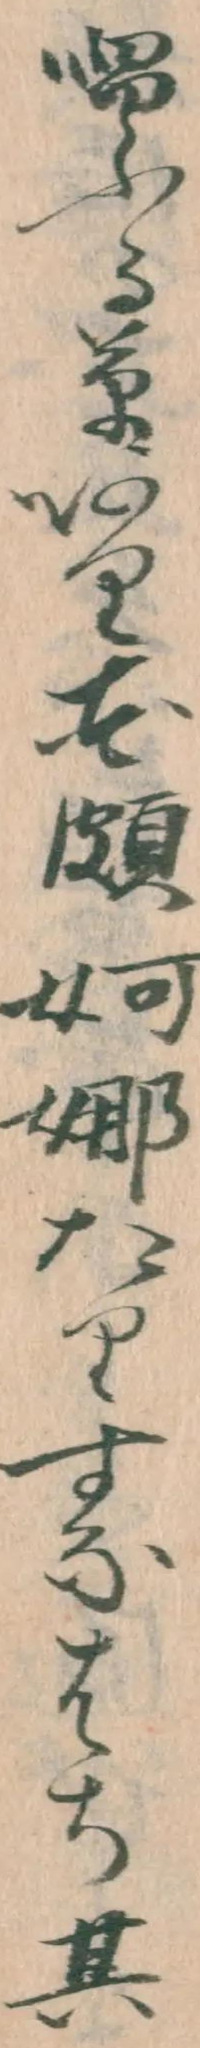唱ふる草あり花頗婀娜たりすなはち其
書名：花菖培養録
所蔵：国立国会図書館 National Diet Library, JAPAN
